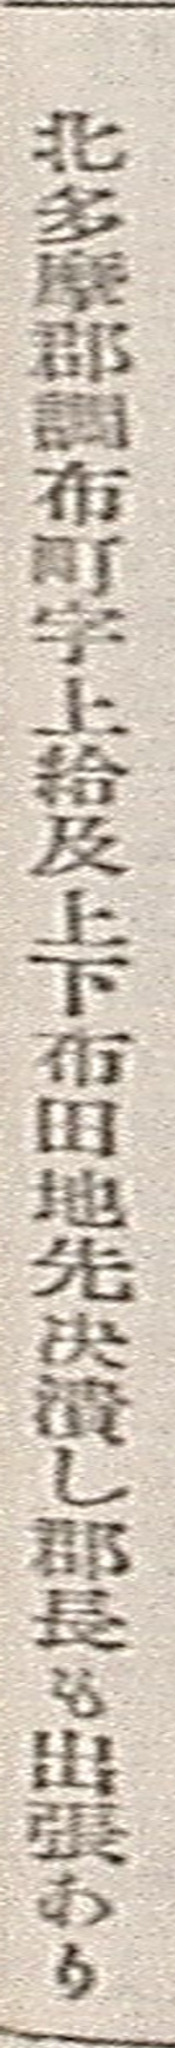北多摩郡調布町字上給及上下布田地先決潰し郡長も出張あり
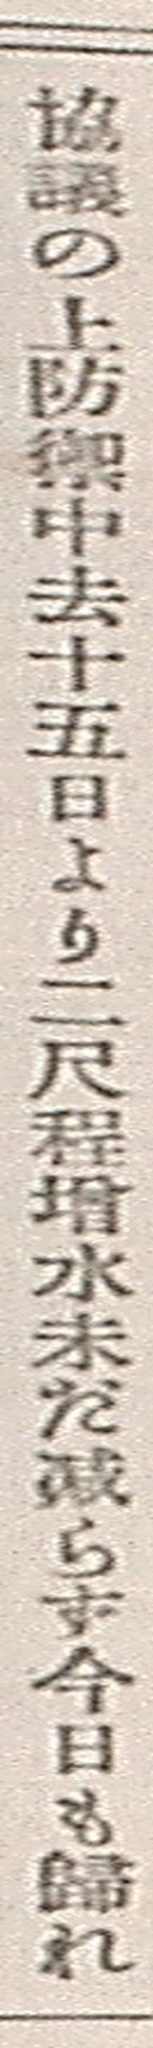協議の上防禦中去十五日より二尺程増水未だ減らず今日も帰れ
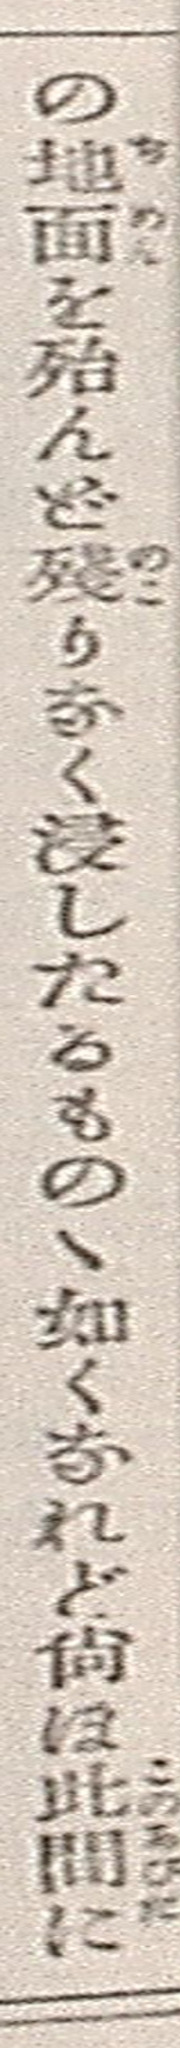の地面を殆んど残りなく浸したるものゝ如くなれど尚ほ此間に
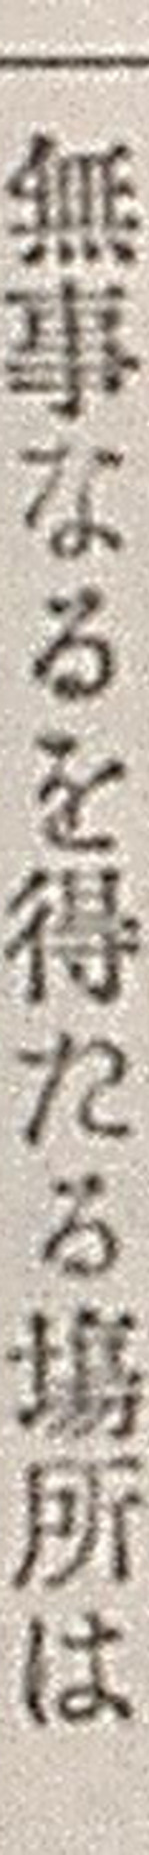無事なるを得たる場所は
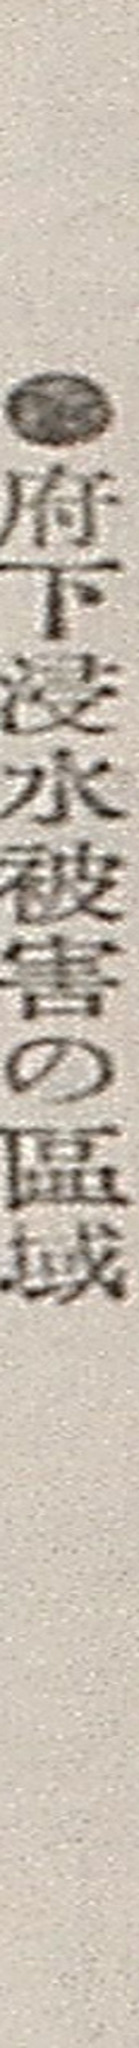●府下浸水被害の区域
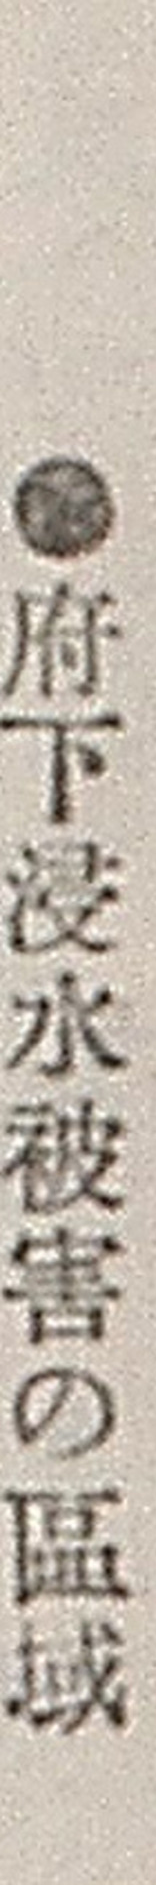●府下浸水被害の区域
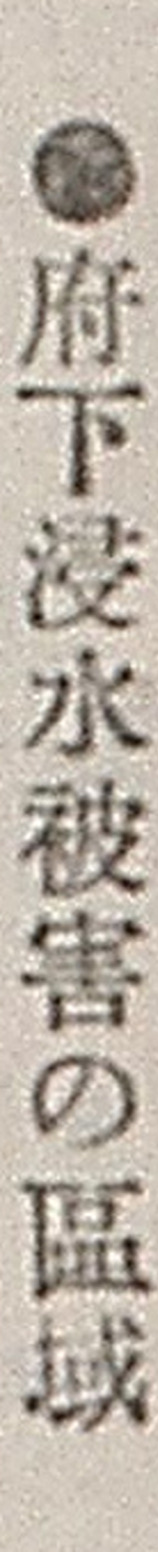●府下浸水被害の区域
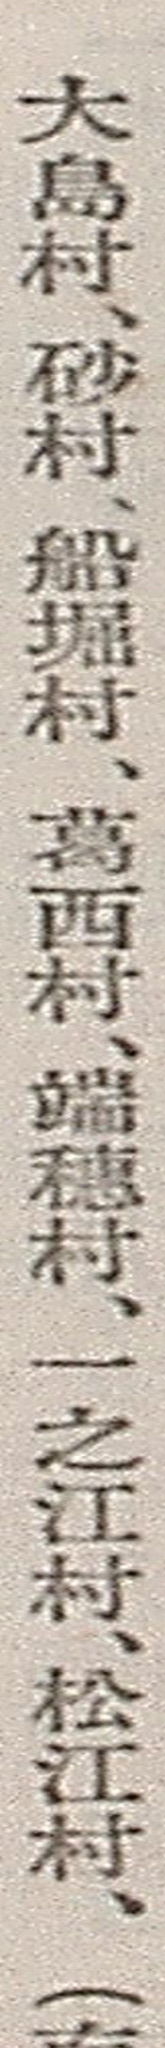大島村、砂村、船堀村、葛西村、端穂村、一之江村、松江村、（南
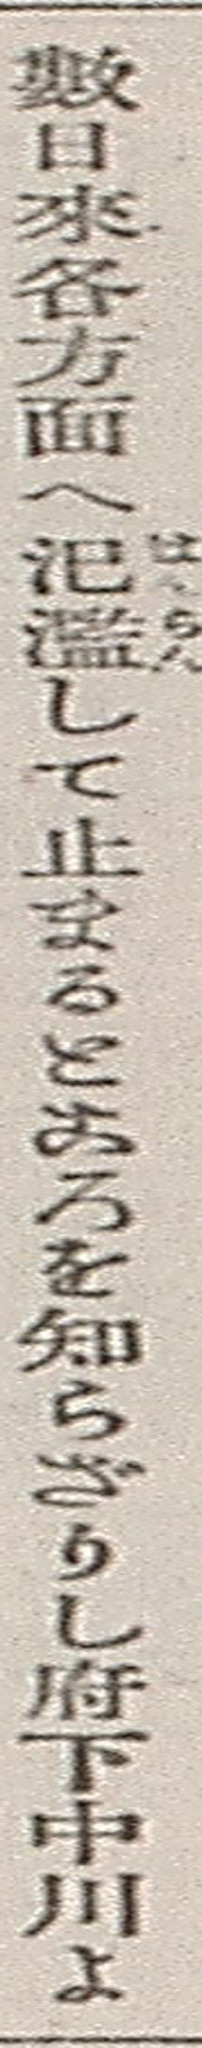数日来各方面へ氾濫して止まるところを知らざりし府下中川よ
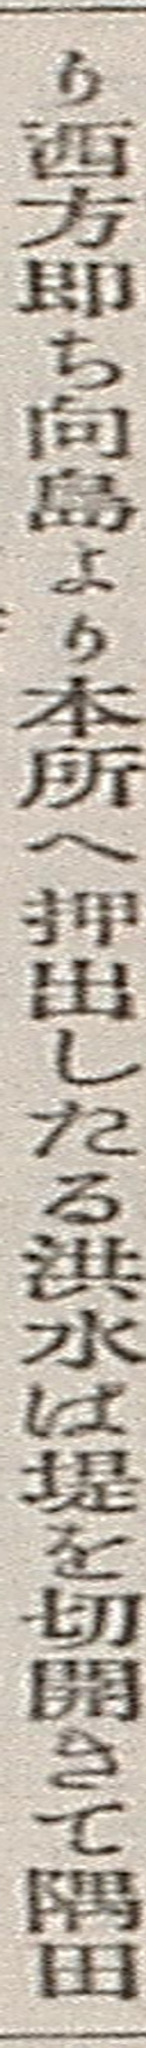り西方即ち向島より本所へ押出したる洪水は堤を切開きて隅田
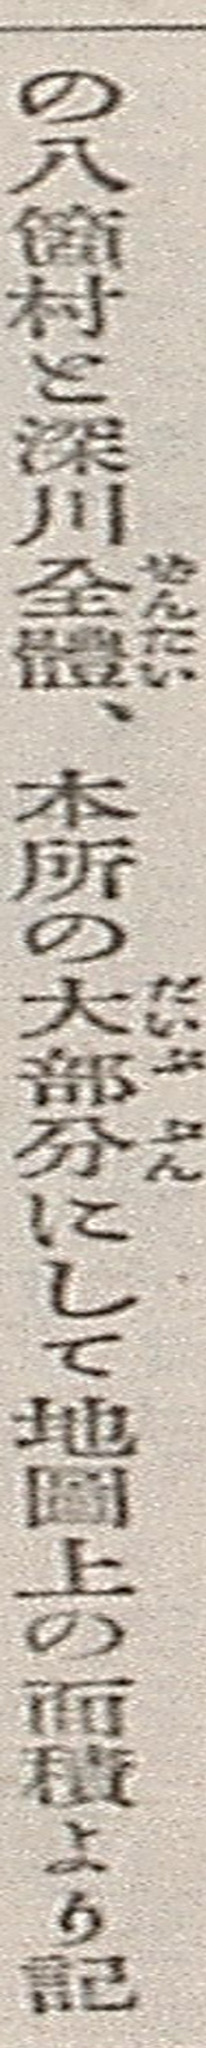の八箇村と深川全体、本所の大部分にして地図上の面積より記
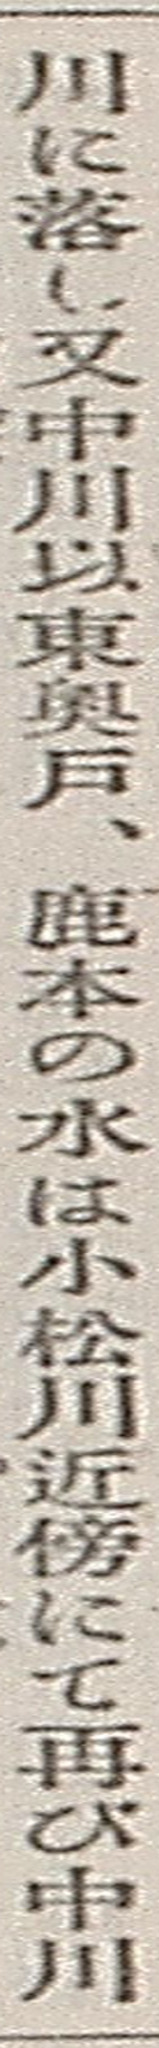川に落し又中川以東奥戸、鹿本の水は小松川近傍にて再び中川
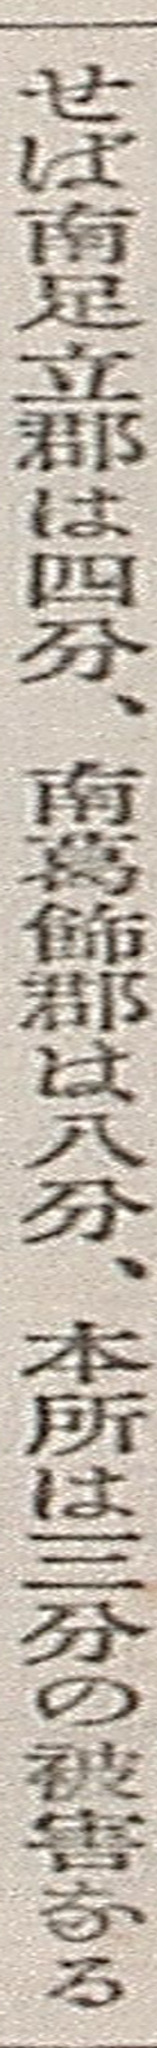せば南足立郡は四分、南葛飾郡は八分、本所は三分の被害なる
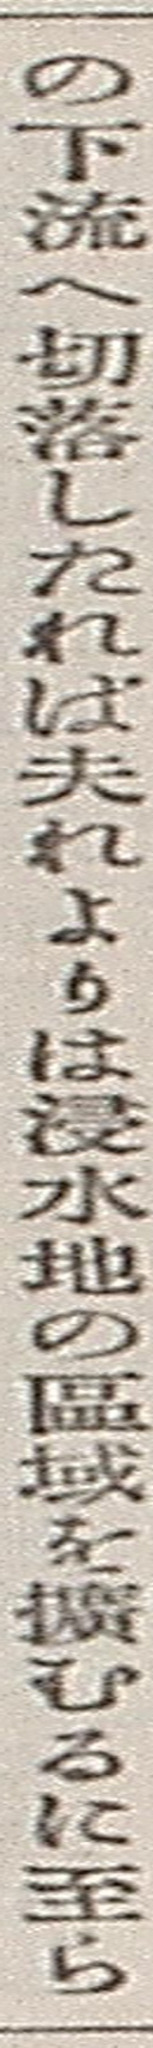の下流へ切落したれば夫れよりは浸水地の区域を拡むるに至ら
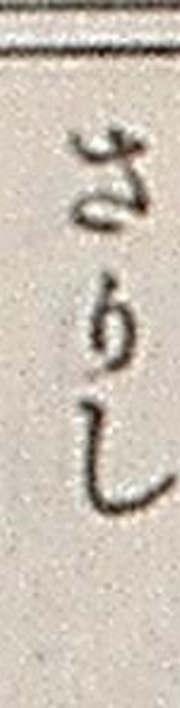さりし
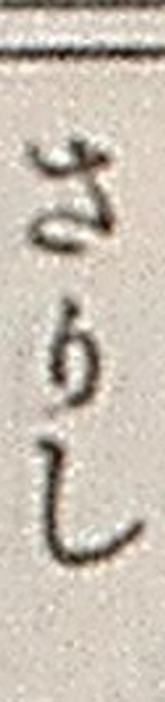さりし
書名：風俗畫報臨時増刊第百二十四號　洪水地震被害録（上）
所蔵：東京大学地震研究所図書室 Earthquake Research Institute Library, The University of Tokyo, JAPAN
